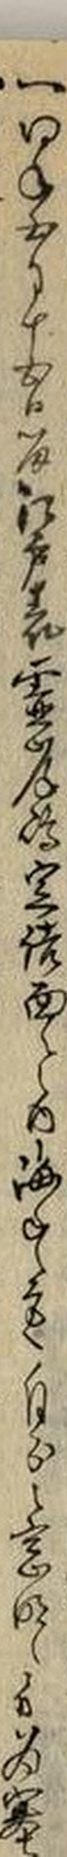一同年五月十五日留江戸表霊岸嶋定詰面々之内海手之方へ自分之窓明候ニ付為塞候留有之
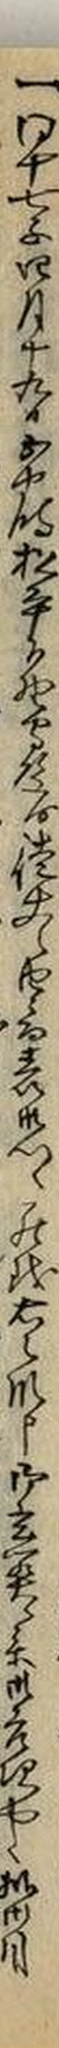一同十七子四月十九日五半時松平下野守殿ゟ徒使之由ニ而表御門へ罷越右之段申御玄関へ参御取次中へ掛御目
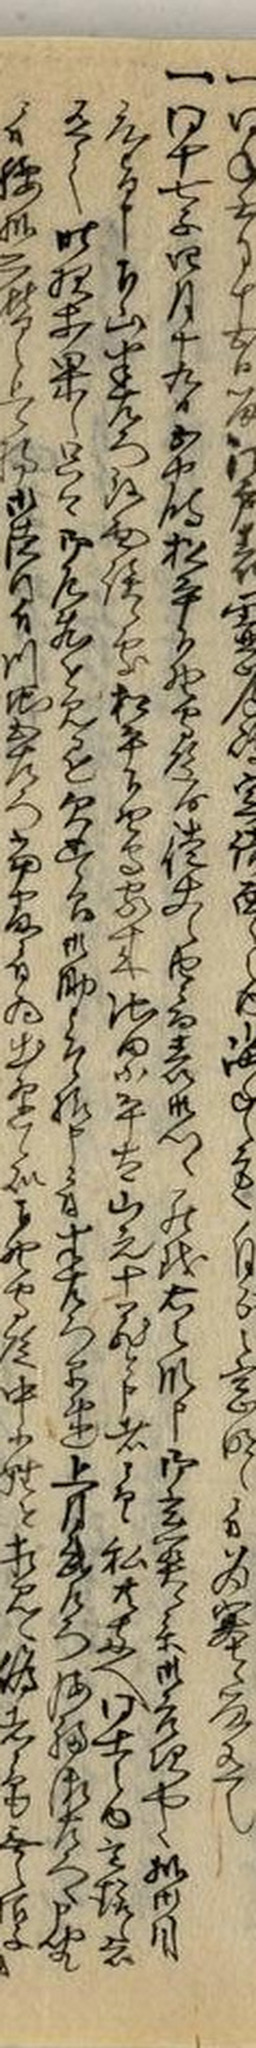度旨申下山半左衛門致面談候処松平下野守家来池田小平太山元十蔵と申者ニ而候私共両人同士之内意趣之者
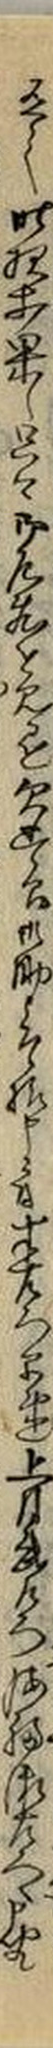有之昨夜相果候只今御屋敷を見懸欠込候間御助被下候様申ニ付半左衛門早速上月武左衛門海福瀬左衛門へ申聞
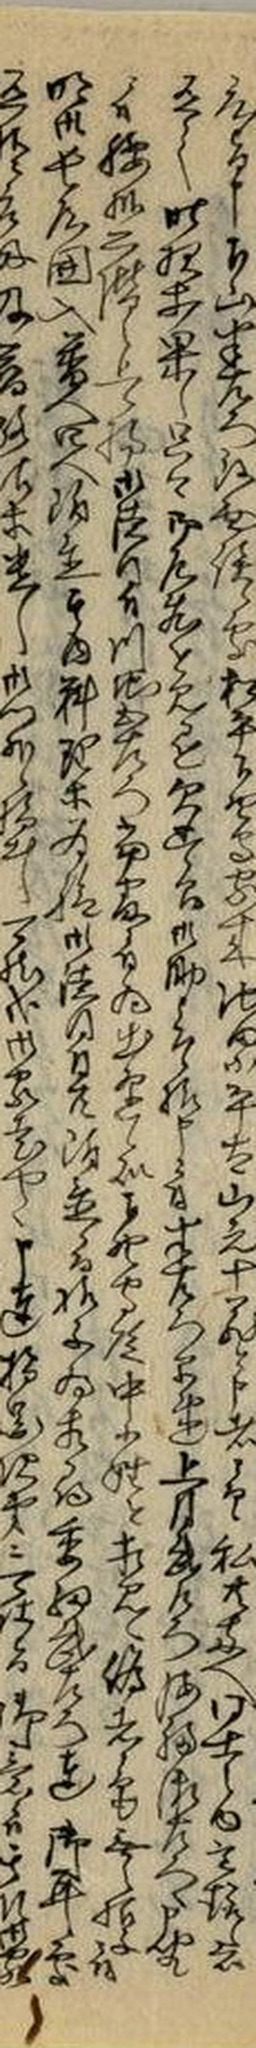ニ付腰掛二階之上へ揚御徒目付川地五左衛門当番ニ付為出迎候処下野守殿中小姓と相見へ偽者ニ而も無之様子ニ付
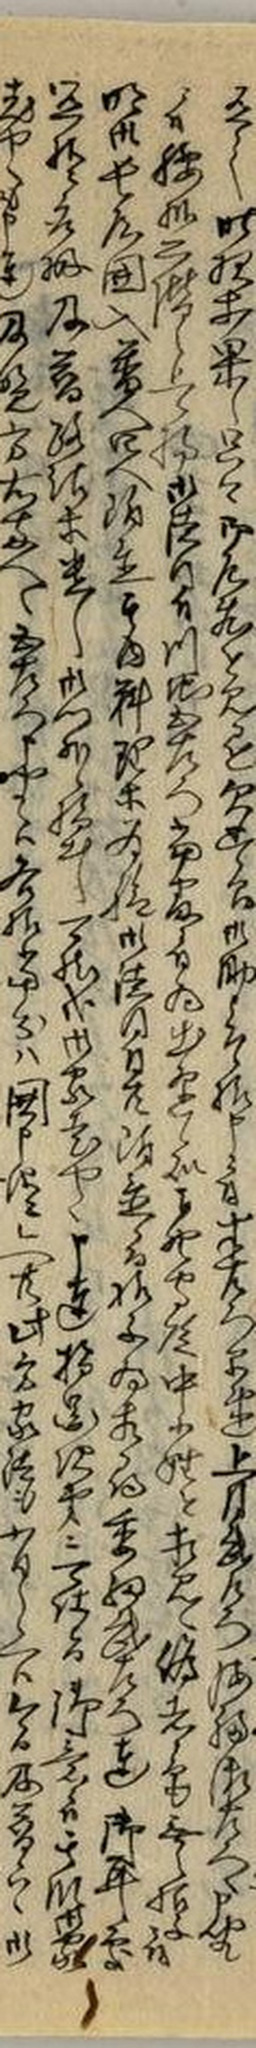明御長屋囲入番人四人附置其内料理等為膳御徒目付共附置候而様子為相尋委細武左衛門達御耳候処
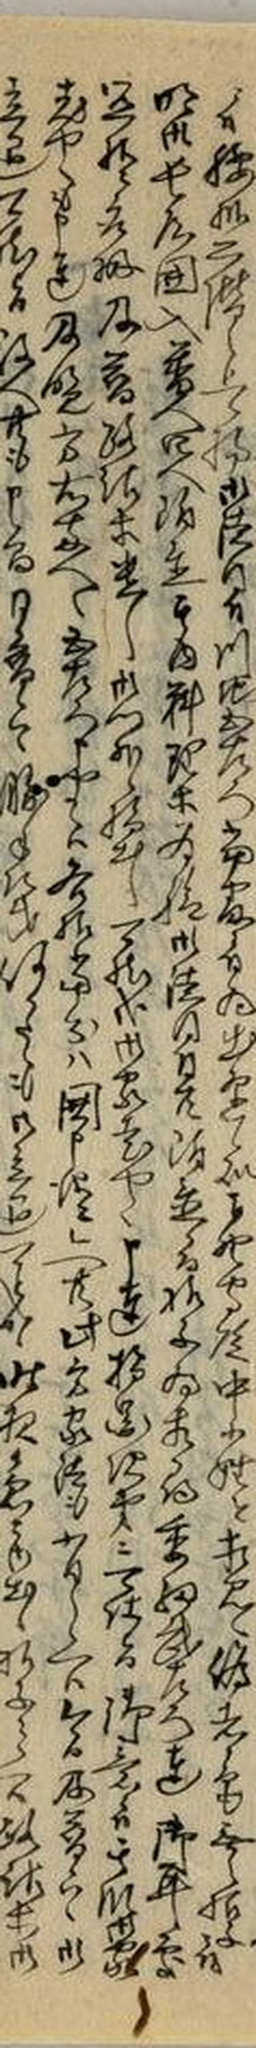宜様ニ取扱及暮路銀等遣之御門外へ指出候可然哉御家老中へ申達指図次第ニ可仕旨御意ニ付其段御家
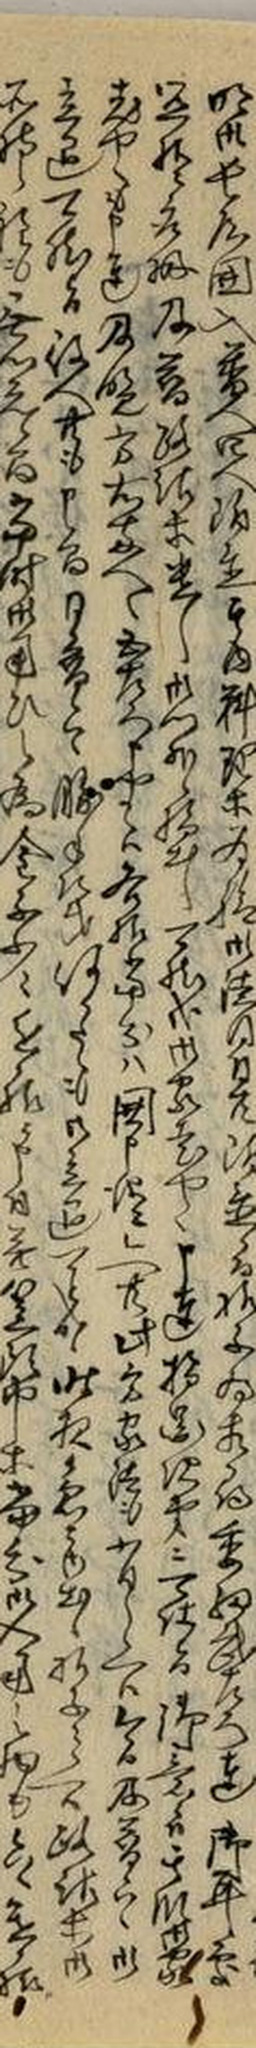老中へも申達及晩方右両人へ五左衛門申聞候ハ各様当分ハ囲申儀ニ候へ共此方家法も有之候ヘハ今日及暮候ハヽ御
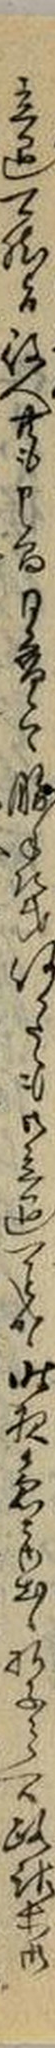立退可然旨役人共も申候間日暮候ハヽ勝手次第何かたへも御立退可被成候昨夜急ニ御出候様子ニ候ヘハ路銀等御
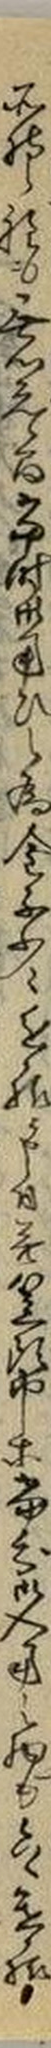所持之程も無心元候間当時御用ひ之為金子少々進候様ニ申付幷笠頭巾等当分御入用之物も候ハヽ遣候様
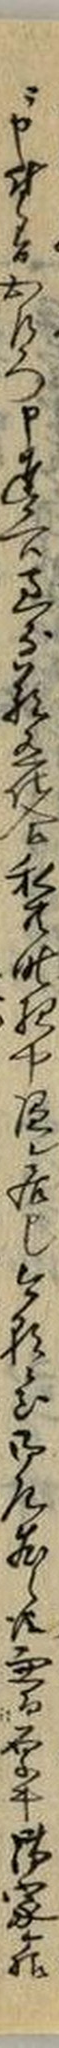ニ申付候旨五左衛門申達候ヘハ過分難有仕合私共昨夜中隠レ居申候今朝ニ至御屋敷之儀兼而厚キ御家ケ様
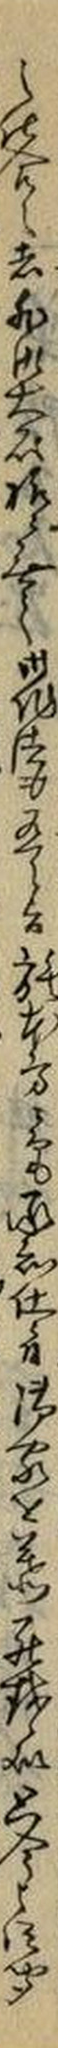之仕合之者外御大名様ニ無之御作法も有之候旨旗本方ニ而も承知仕ニ付御家を慕罷越候処只今被仰聞
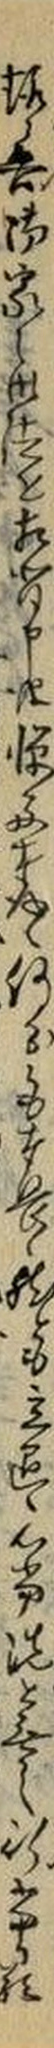趣之上ハ御家之御法を相背申儀憚多奉存候何分ニも奉畏候然とも立退候心当
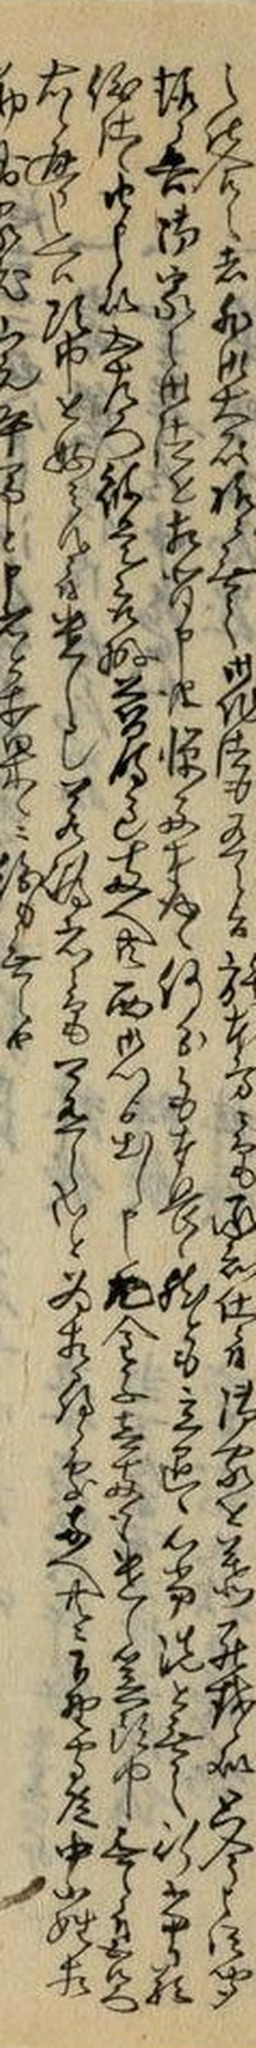儀仕候由申候処五左衛門彼是取扱暮時過両人共西御門ゟ出し申候尤金子壱両ツヽ遣之笠頭巾無之ニ付五左衛門
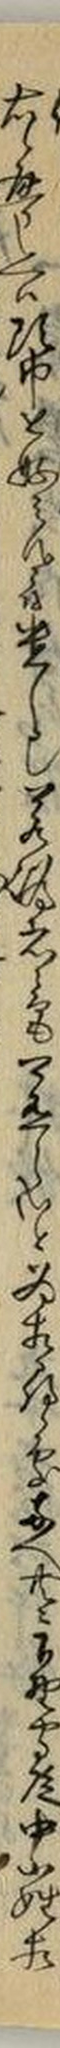右之通申候ヘハ頭巾を好ミ候ニ付遣之申候若偽物ニ而も可有之哉と為相尋候処両人共ニ下野守殿中小姓相
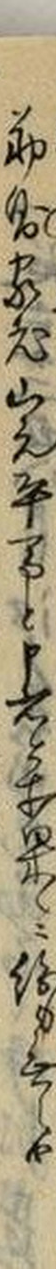勤則家老山元平馬と申者被相果候ニ紛も無之候由
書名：御国他国諸事之部
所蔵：福井県文書館 Fukui Prefectural Archives
